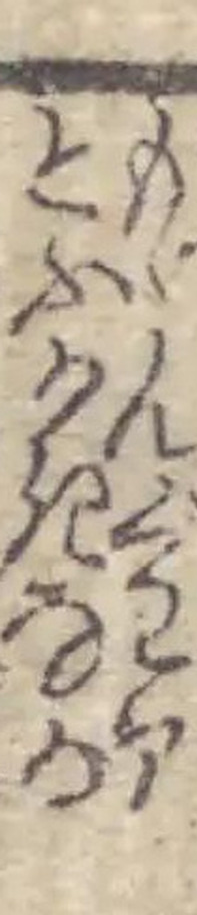とふかきなか
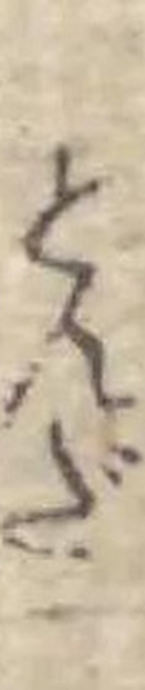とんだ
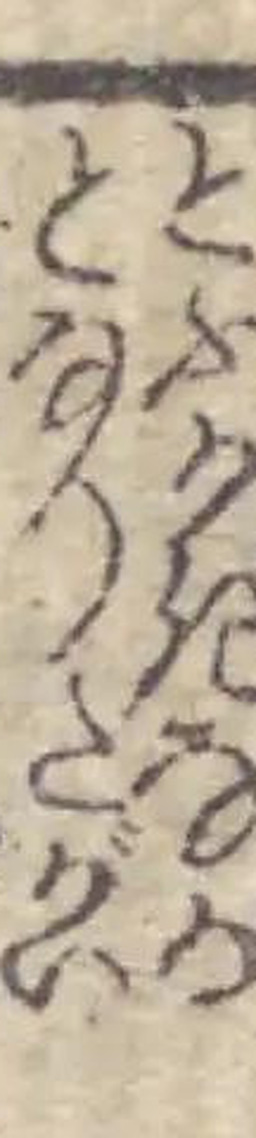となりたがい
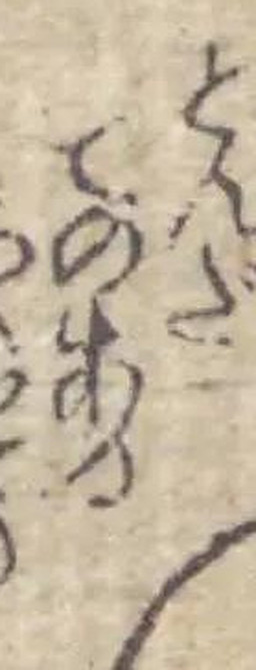てのある
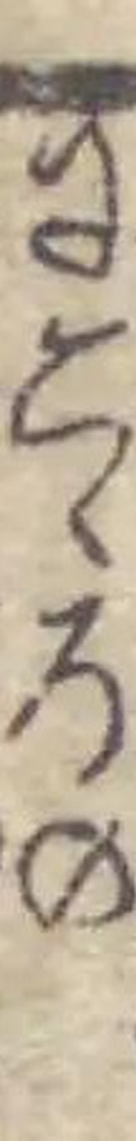にこゝろの
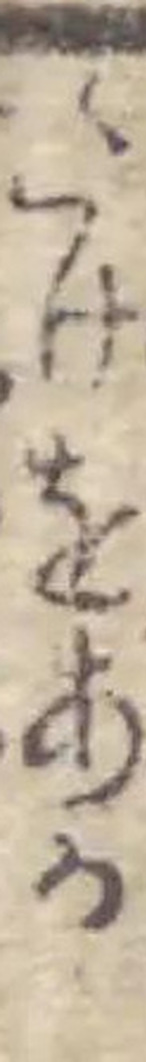たけをあか
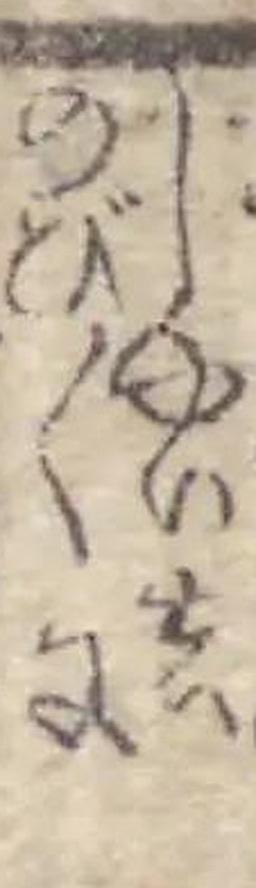のび〳〵に
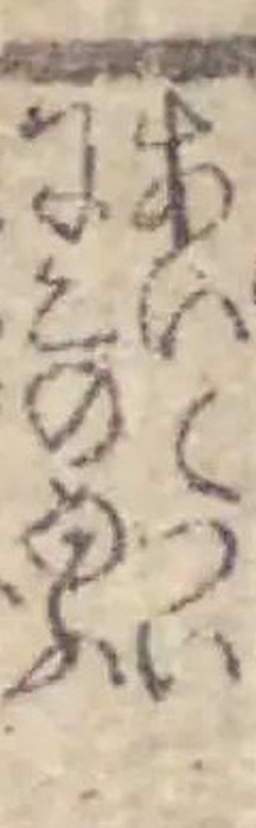にこのゆふ
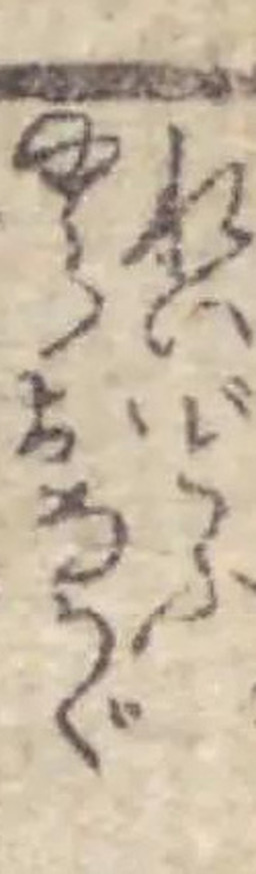やらおなかゞ
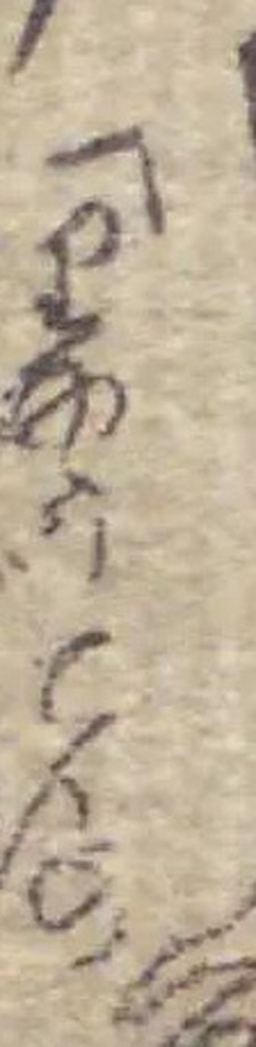〽りやうてんの
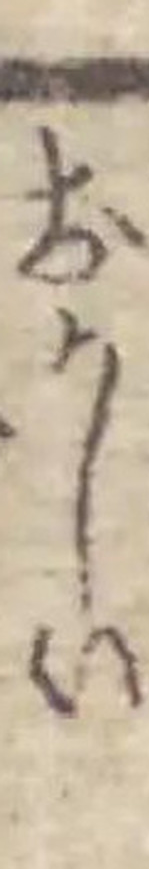おかしい
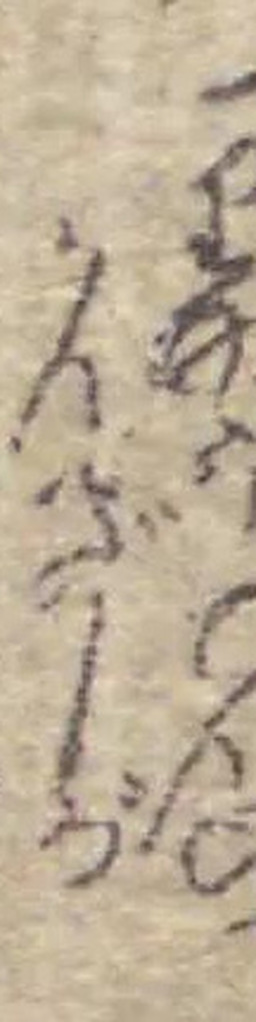かんざしが
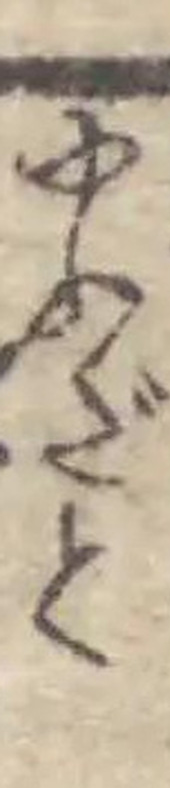やふだと
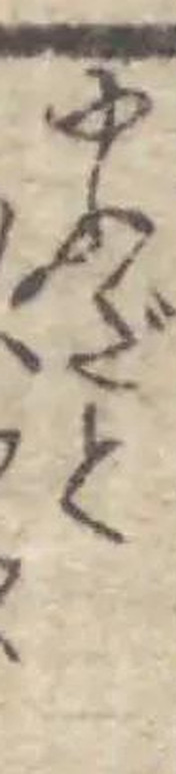やふだと
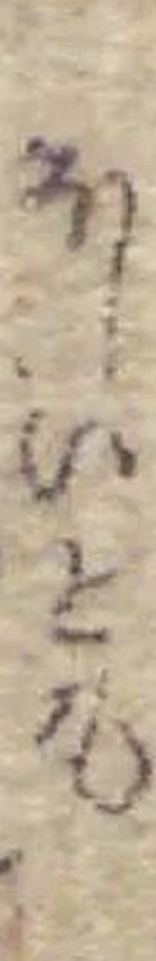ほしいとも
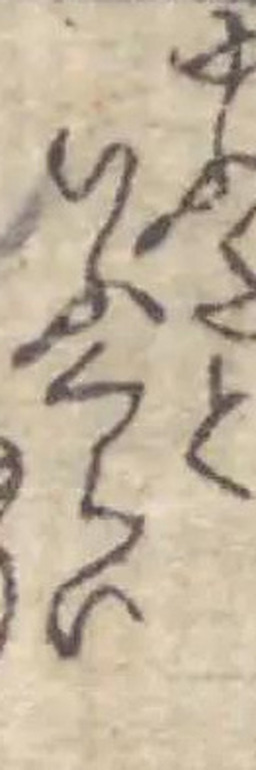いふくらい
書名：化物尽 4巻
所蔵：国立国会図書館 National Diet Library, JAPAN
